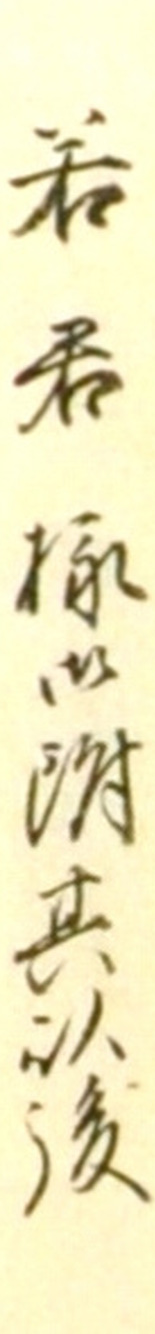若君様御附其以後
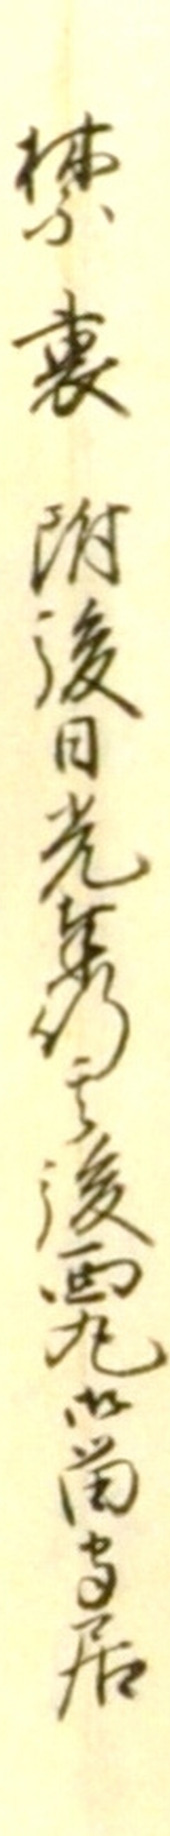禁裏附後日光奉行其後西丸御留守居

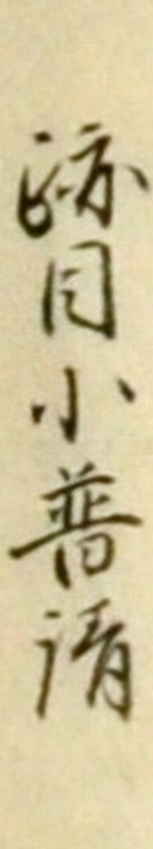跡目小普請
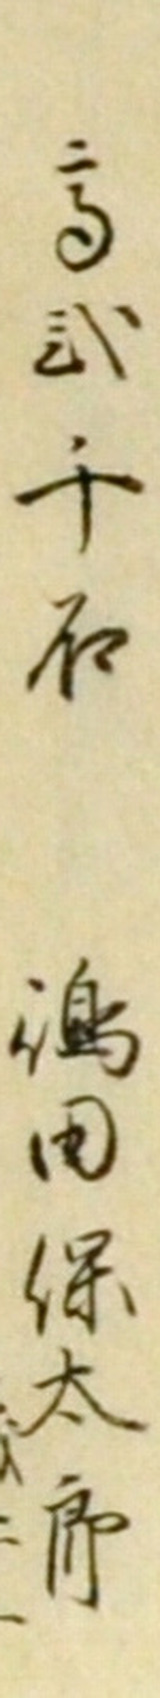高弐千石嶋田保太郎
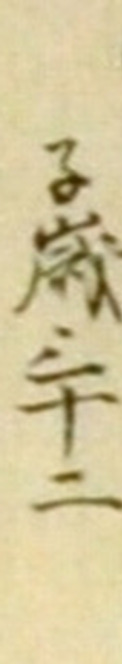子歳三十二
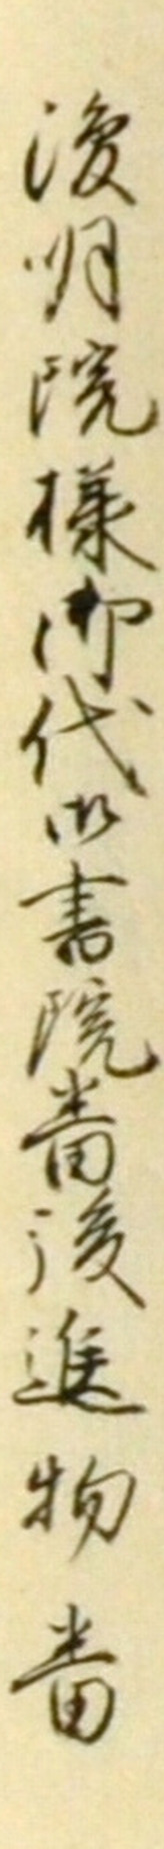浚明院様御代御書院番後進物番
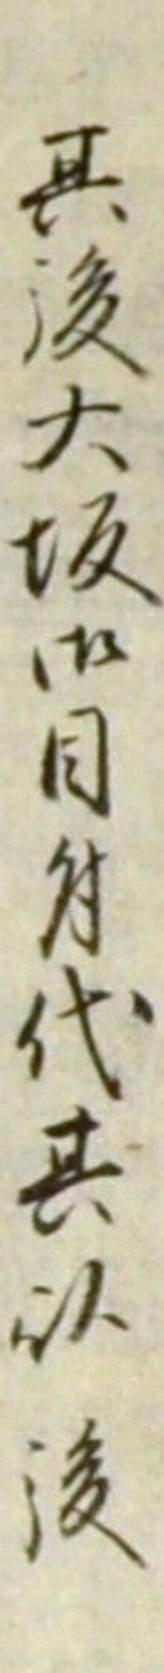其後大坂御目付代其以後
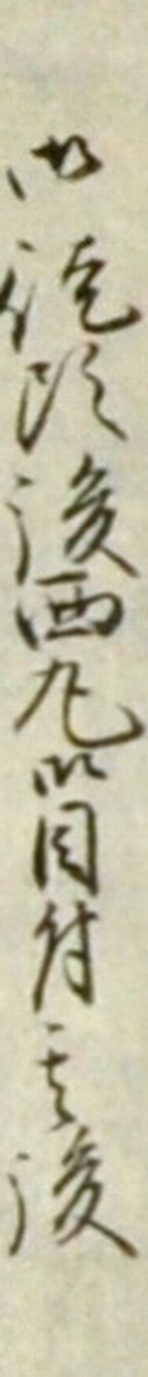御徒頭後西丸御目付其後
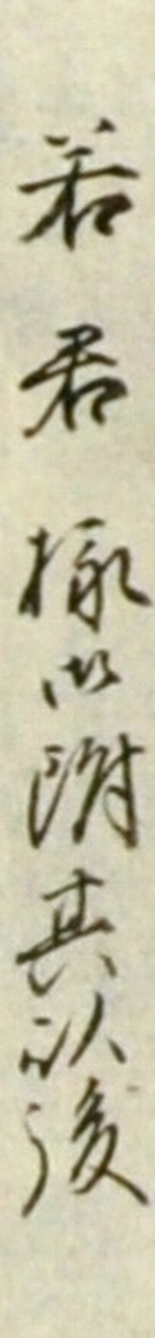若君様御附其以後
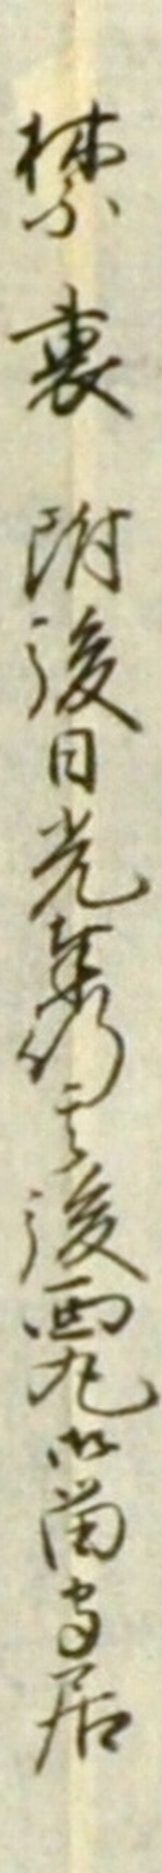禁裏附後日光奉行其後西丸御留守居
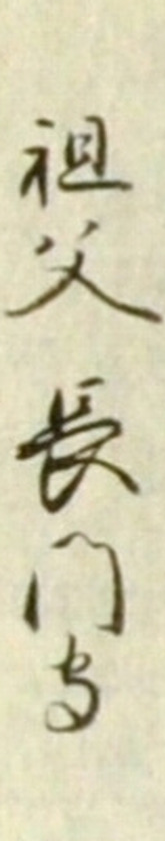祖父長門守
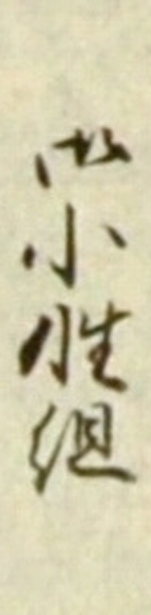御小姓組
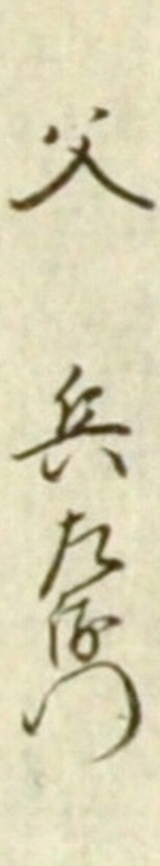父兵左衛門
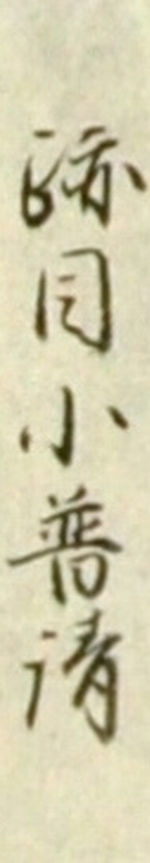跡目小普請
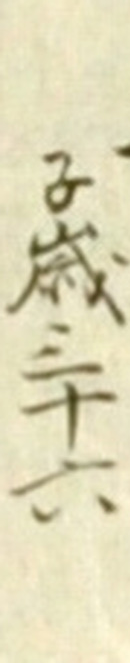子歳三十六
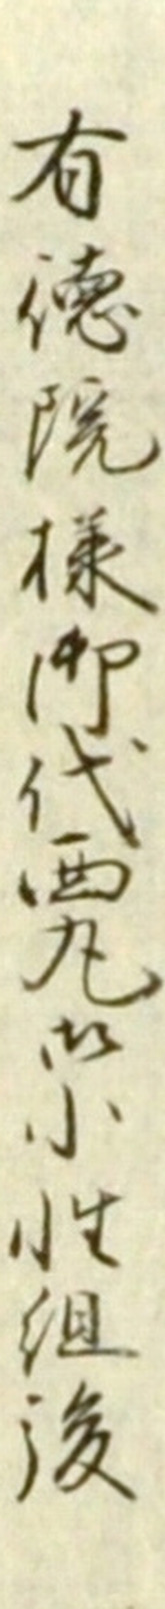有徳院様御代西丸御小姓組後
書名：若年寄御役中御調書付
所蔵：伊那市立高遠町図書館・合同会社AMANE
